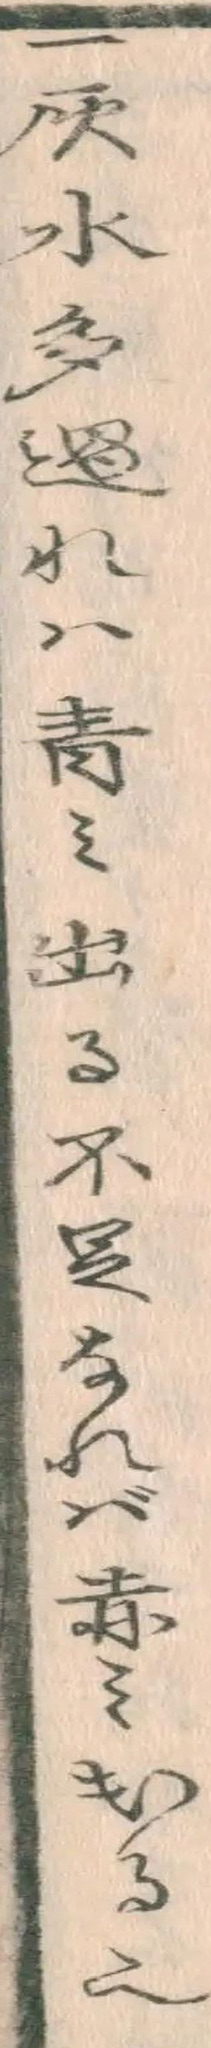一灰水多過れは青み出る不足なれば赤み出る也
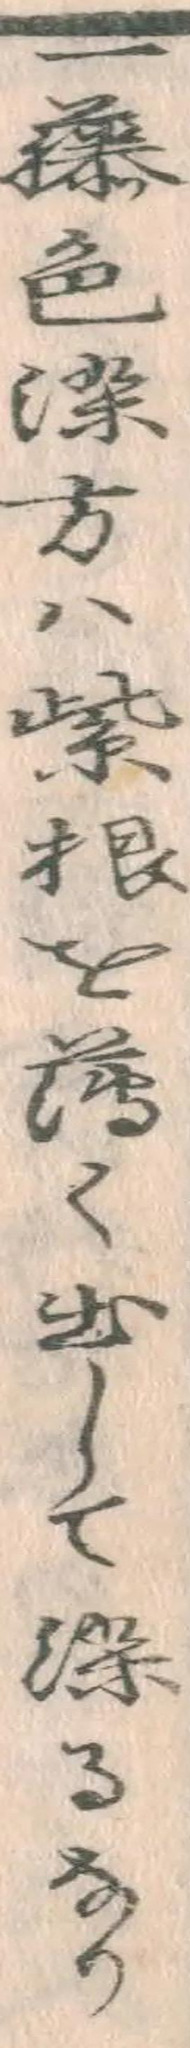一藤色染方は紫根を薄く出して染るなり
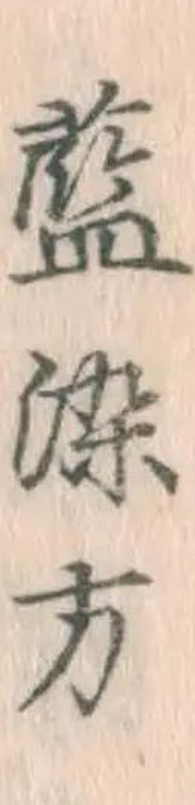藍染方
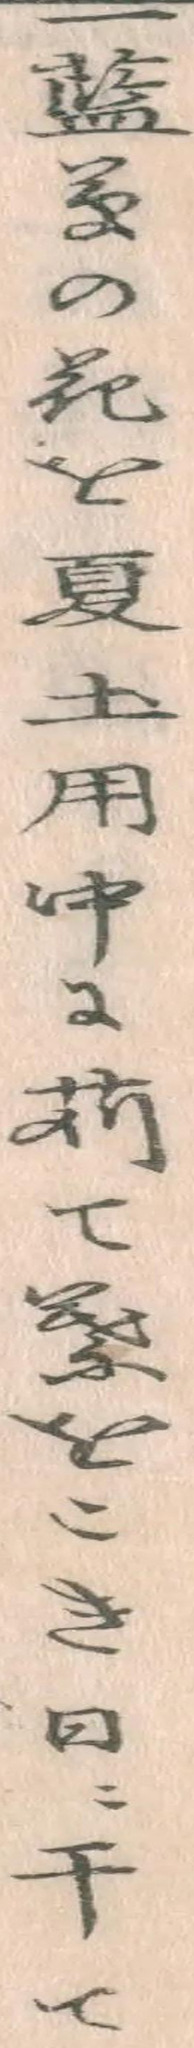一藍草の花を夏土用中に苅て葉をこき日に干て
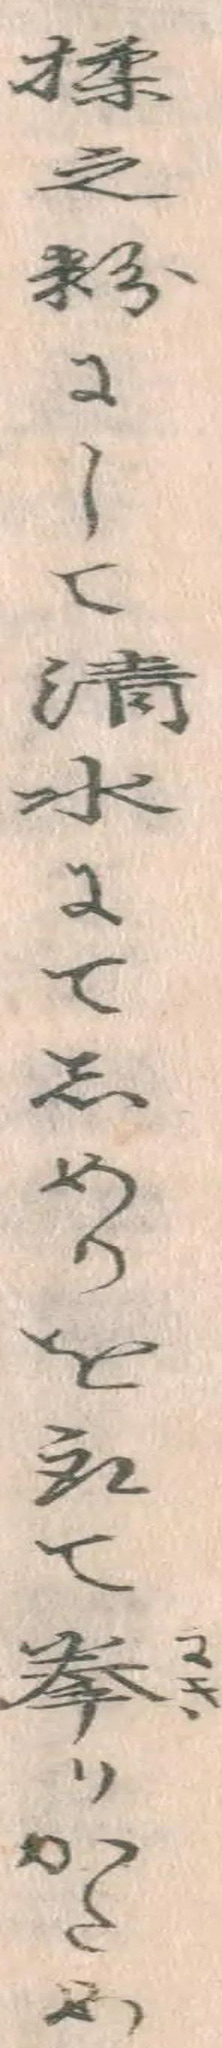揉之粉にして清水にてしめりを取て拳りかため
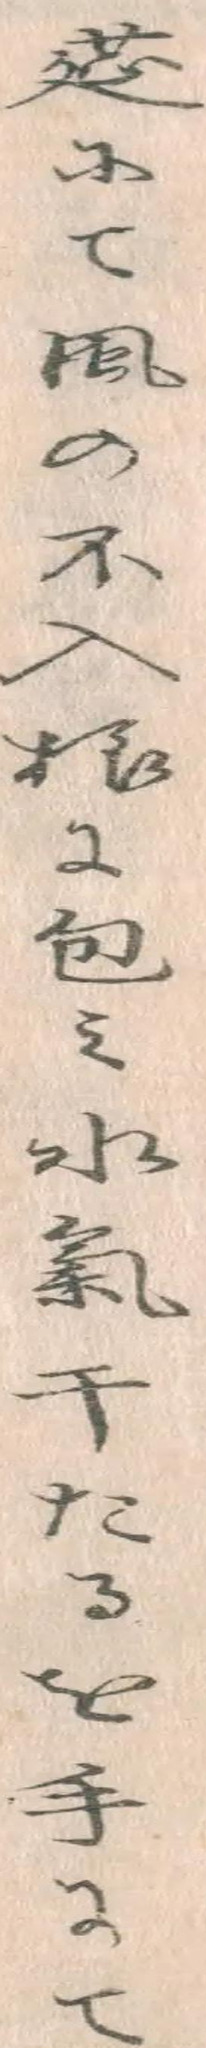莚にて風の不入様に包み水気干たるを手にて
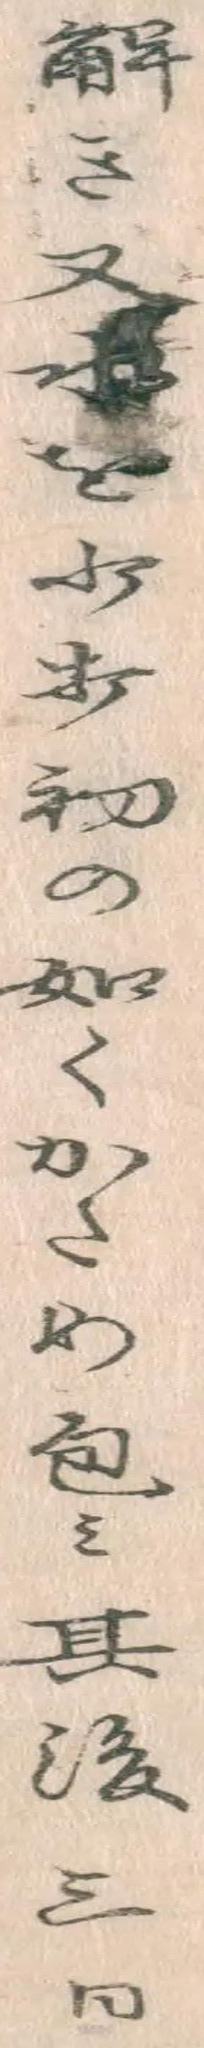解き又水を少打初の如くかため包み其後三日
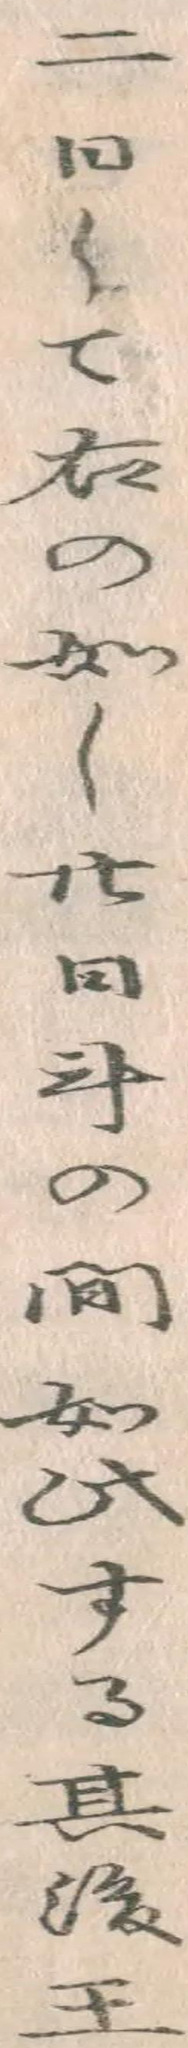二日して右の如し廿日斗の間如此する其後王
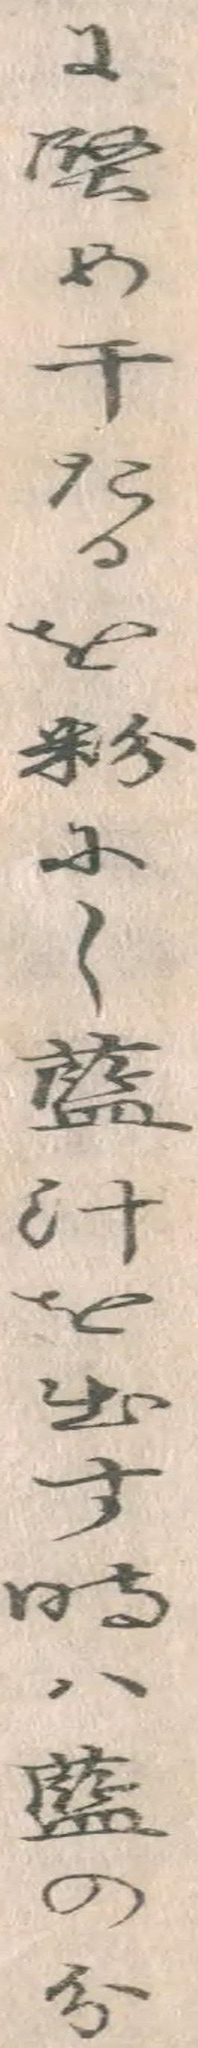に堅め干たるを粉にし藍汁を出す時は藍の分
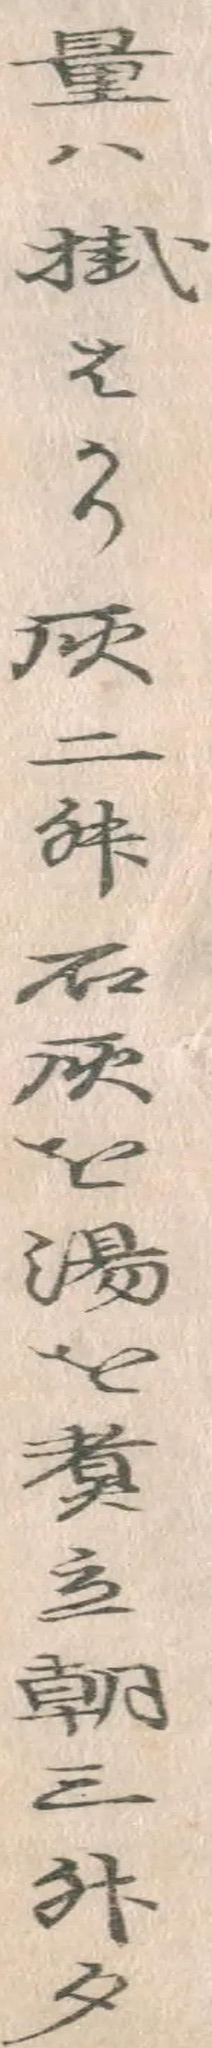量は掛はかり灰二升石灰を湯を煮立朝三升夕
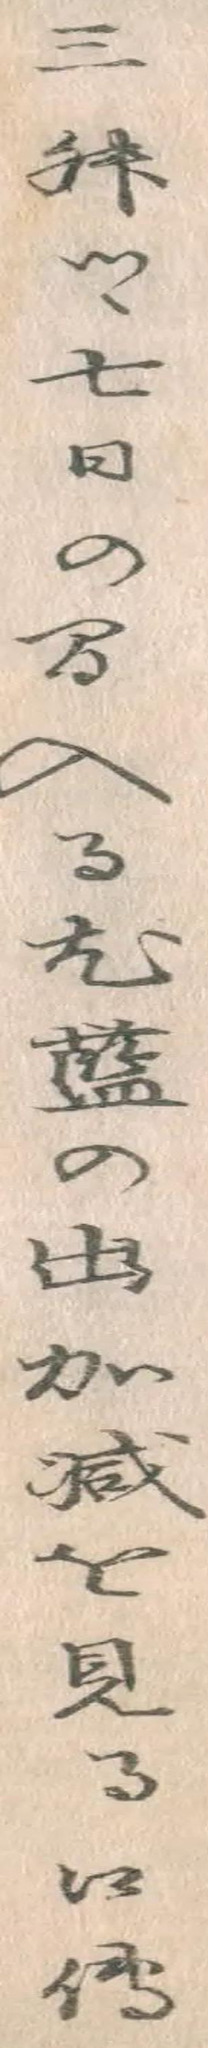三升つゝ七日の間入る尤藍の出加減を見る口伝
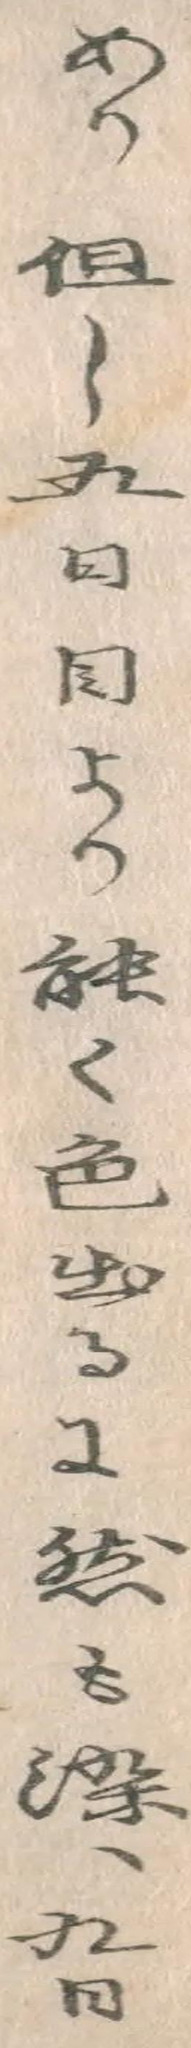あり但し五日目より能く色出るに然も染九日
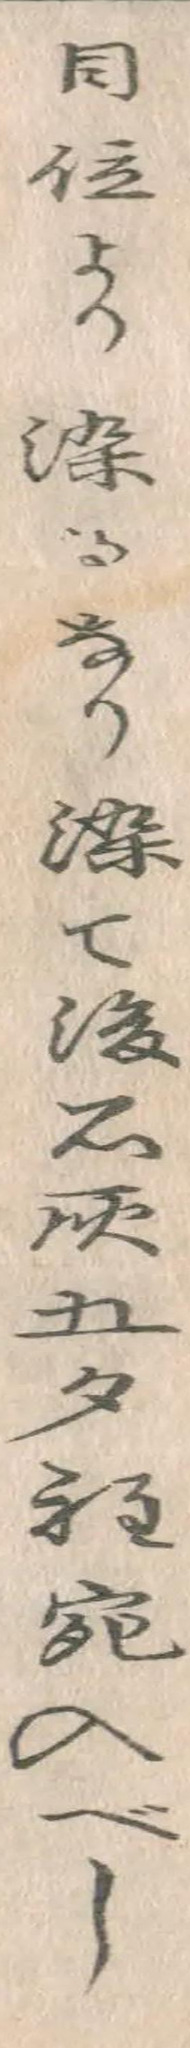目位より染るなり染て後石灰五勺程宛入べし
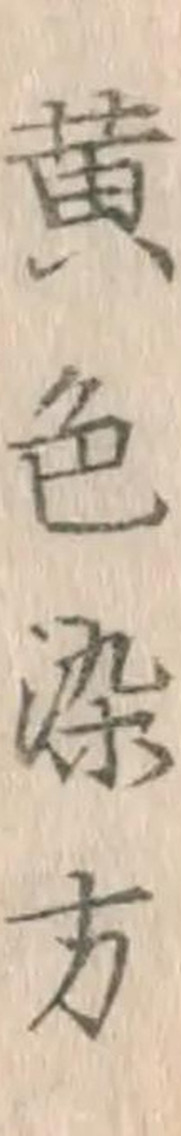黄色染方

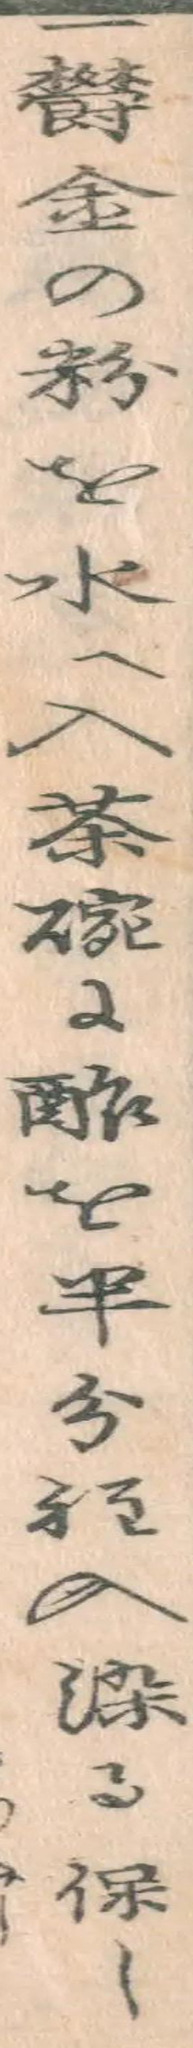一鬱金の粉を水へ入茶碗に酢を半分程入染る保し
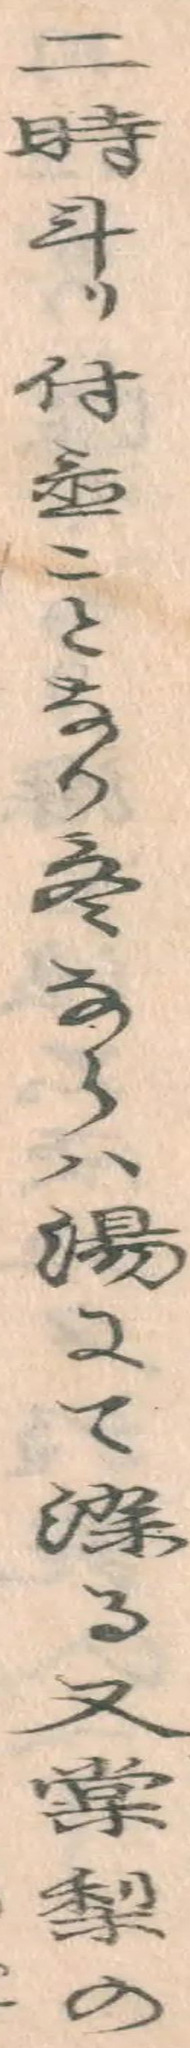二時斗り付置ことなり冬ならは湯にて染る又棠梨の
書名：機織彙編 5巻. [1]
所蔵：国立国会図書館 National Diet Library, JAPAN
